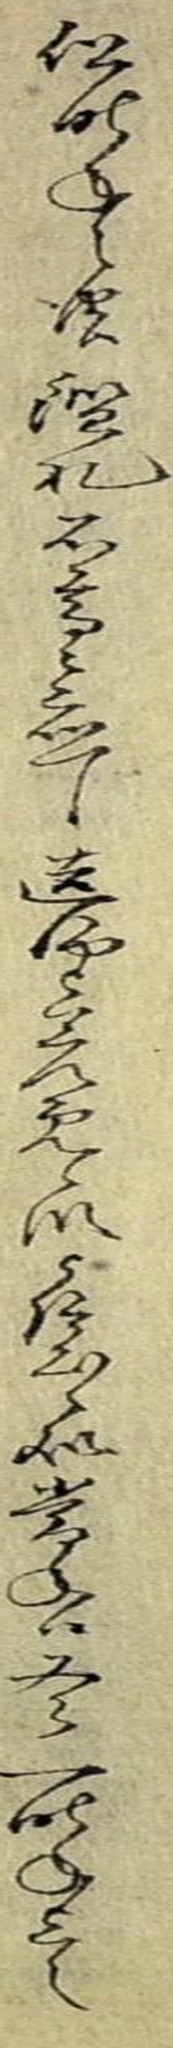但昨年之儀は鑑札石高に応し造酒被差免候段被仰出候処当年は又々一昨年迄之
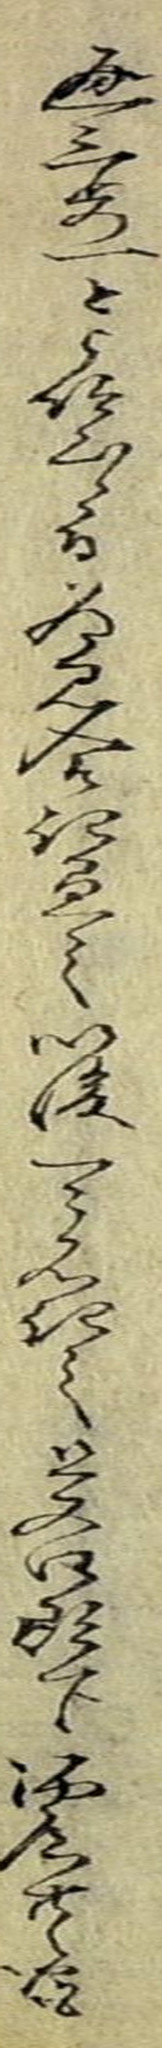通三歩一と被仰出候に付為見合記置之以後可不記之且又四郡下酒屋共之儀も
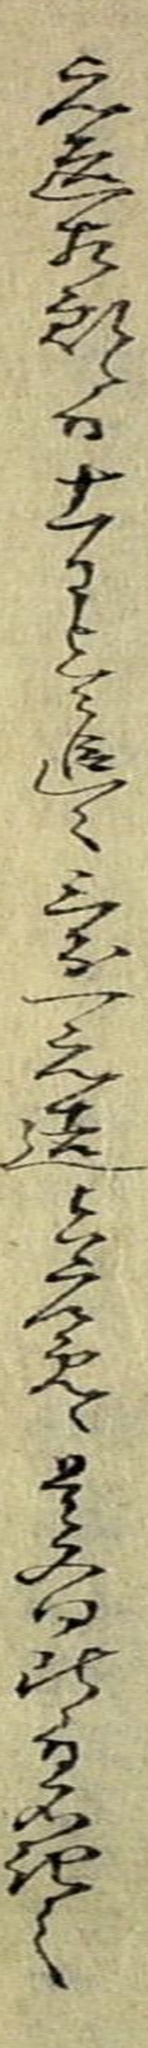元造相願候に付十一月迄に追々三分一元造被差免候是又同断に付不記之
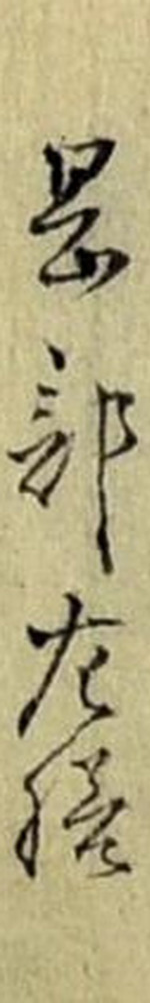岡部左膳
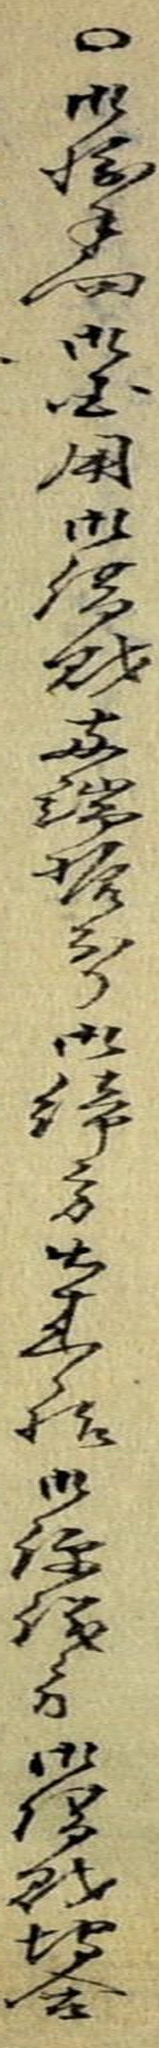○御勝手向御国用御借財両端振分り御締方出来候様御評議に付御借財埒合
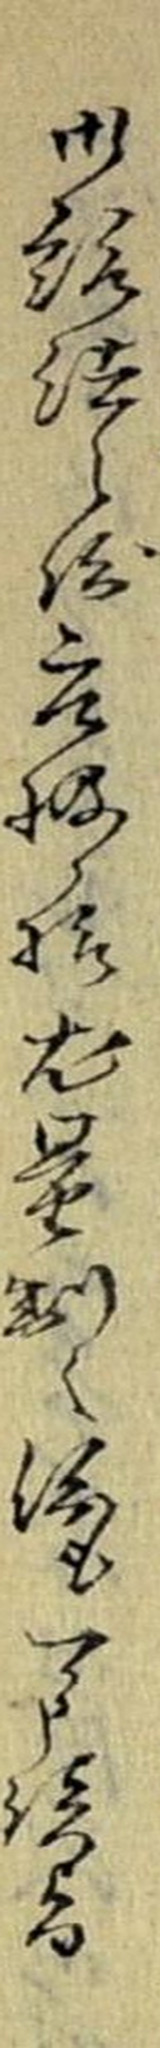御趣法之儀取扱候様尤量制之儀も可申談旨
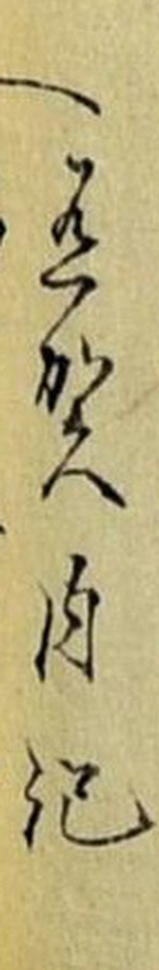有賀内記
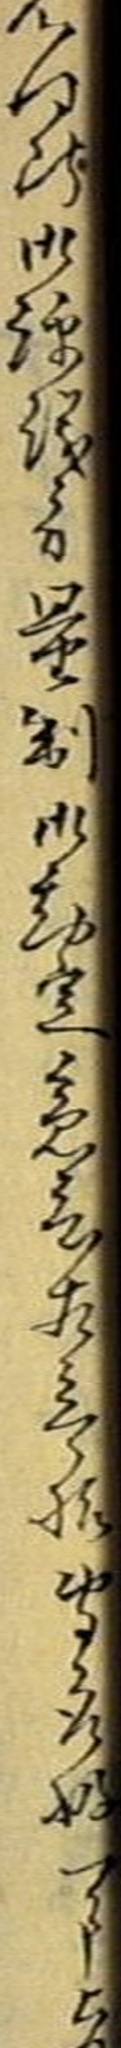○右同断御評議に付量制御勘定急度相立候様専取扱可申旨
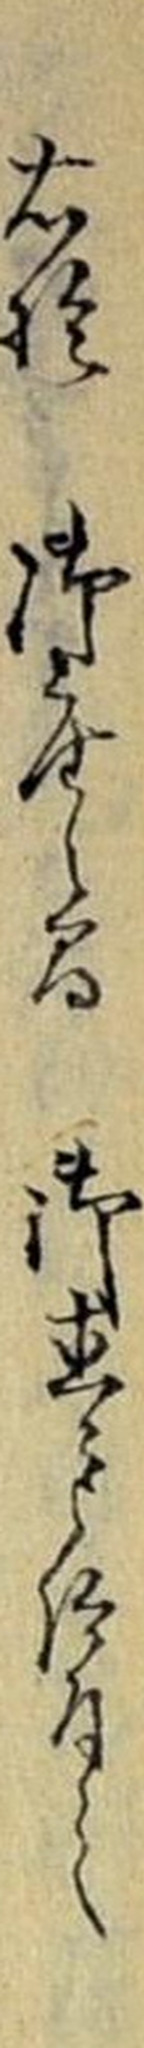右於御座之間御直々被仰付候
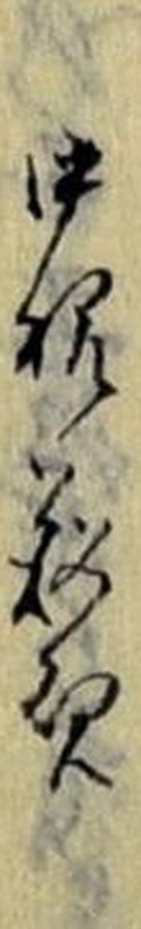中根靭負
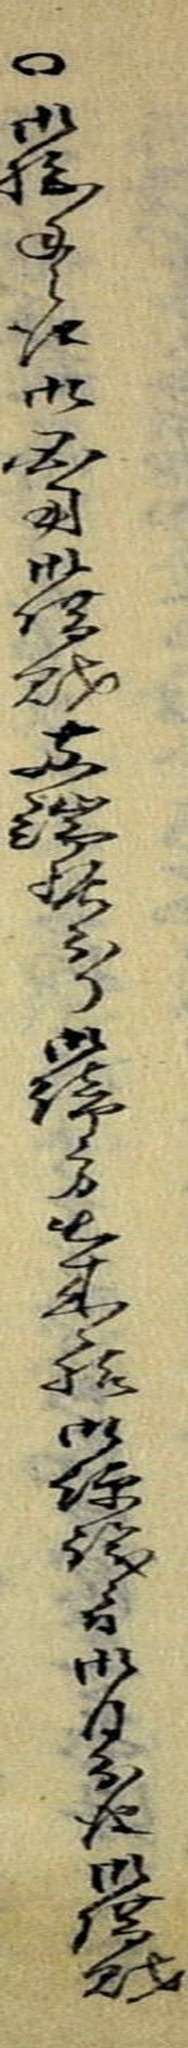○御勝手之儀御国用御借財両端振分り御締方出来候様御評議に付御自分儀御借財
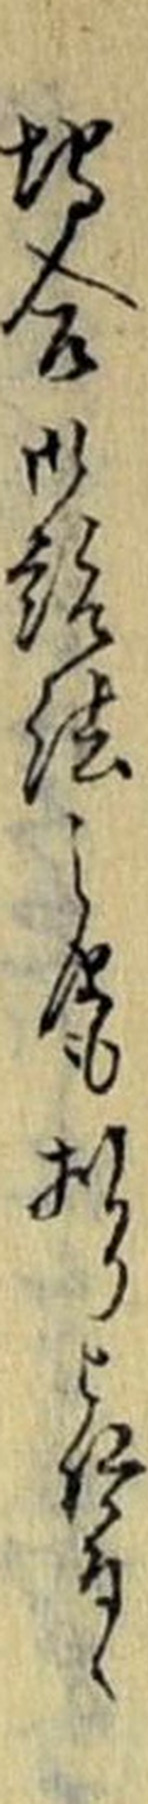埒合御趣法之儀も掛り被仰付候
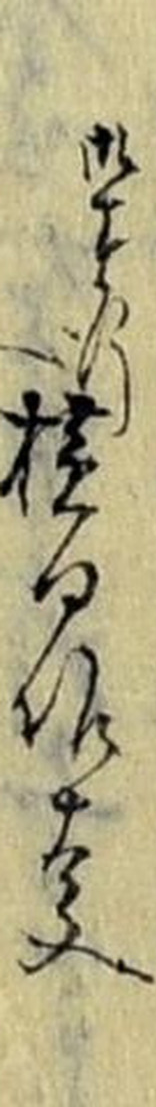横田作太夫
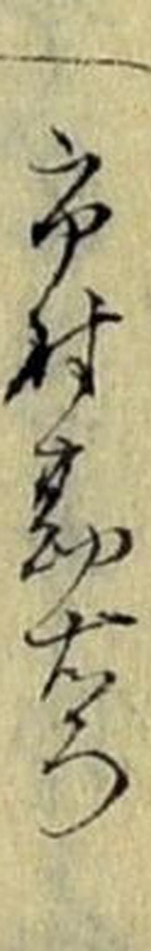市村勘右衛門
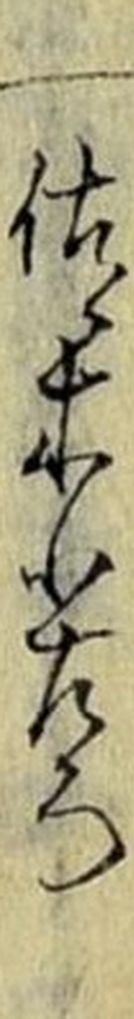佐々木小左衛門
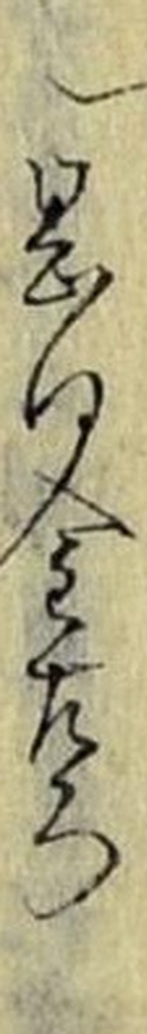岡田金左衛門
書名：命令之部 六
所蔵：福井県文書館 Fukui Prefectural Archives
